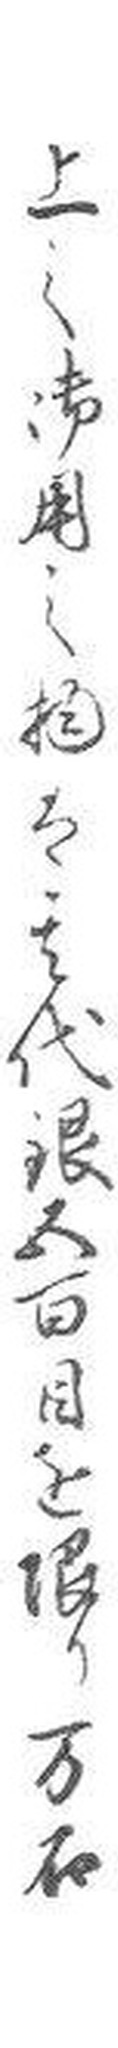上之御用之物は其代銀五百目を限り万石
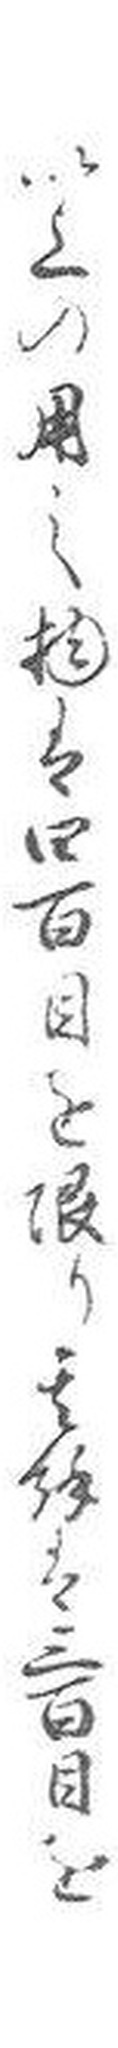以上の用之物は四百目を限り其余は三百目を
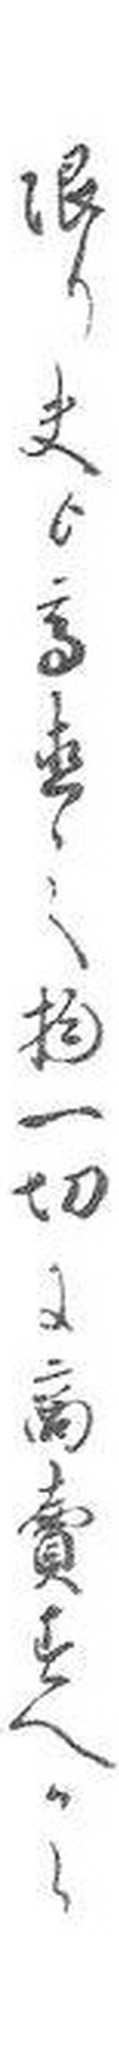限り夫ゟ高直之物一切に商売すへから
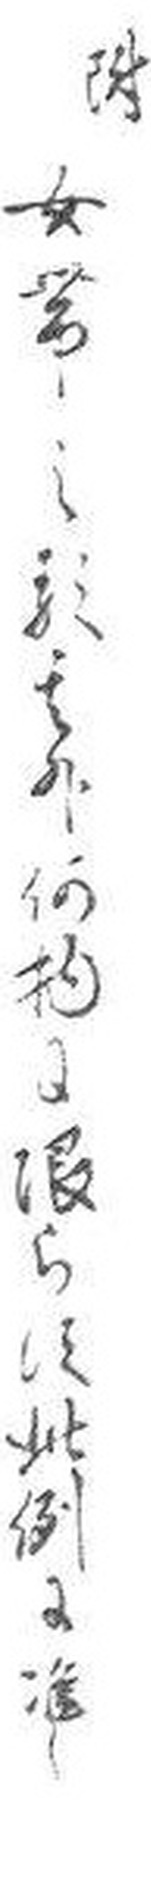女帯之類其外何物に限らす此例に準し
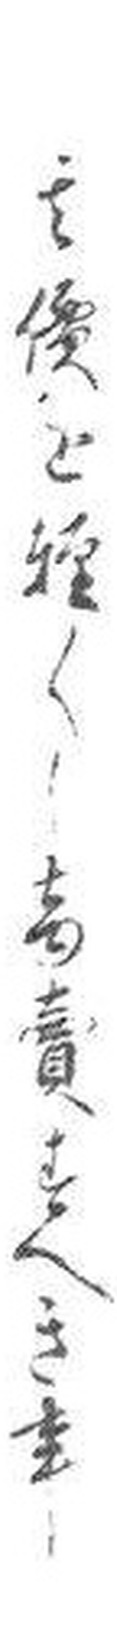其價を軽くし商売すへき事
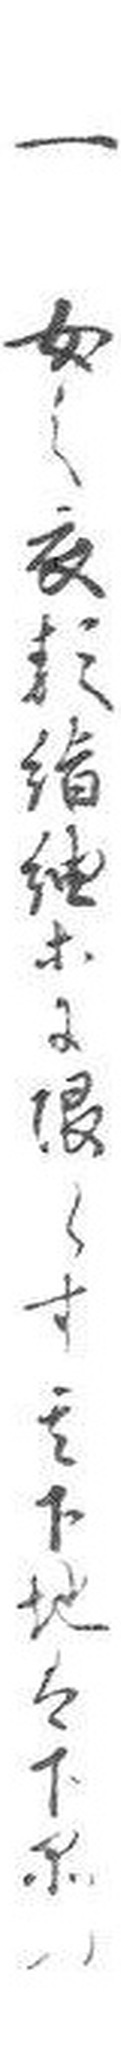一女之衣類絹紬等に限らす其下地は下品の
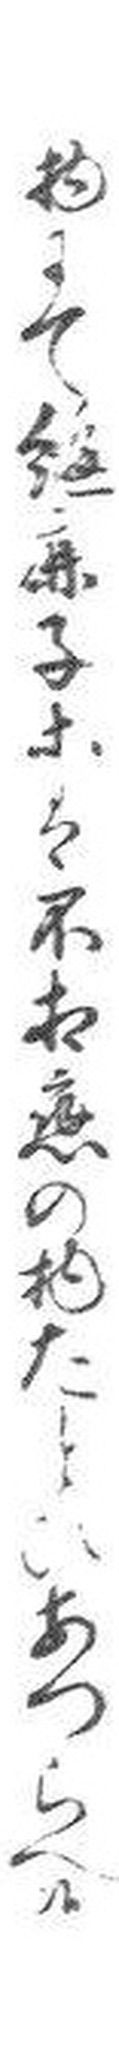物にて縫鹿子等は不相応の物たとひあつらへ候
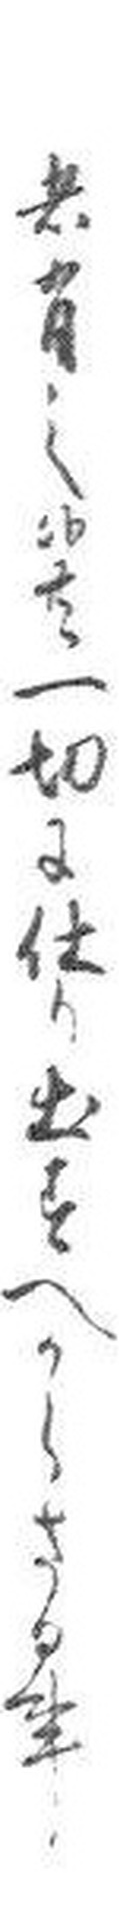者有之候共一切に仕り出すへからさる事
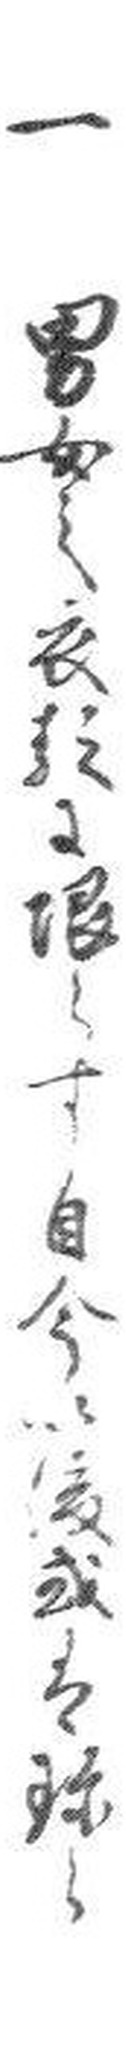一男女之衣類に限らす自今以後或は珍ら
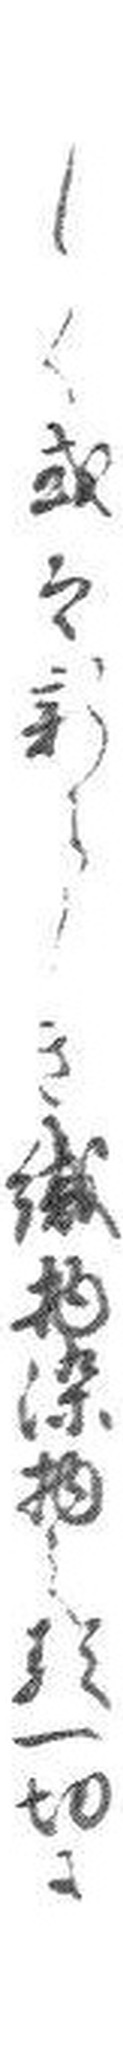しく或は新らしき織物染物之一類一切に
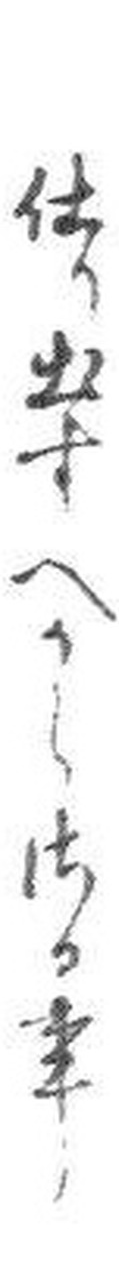仕り出すへからさる事
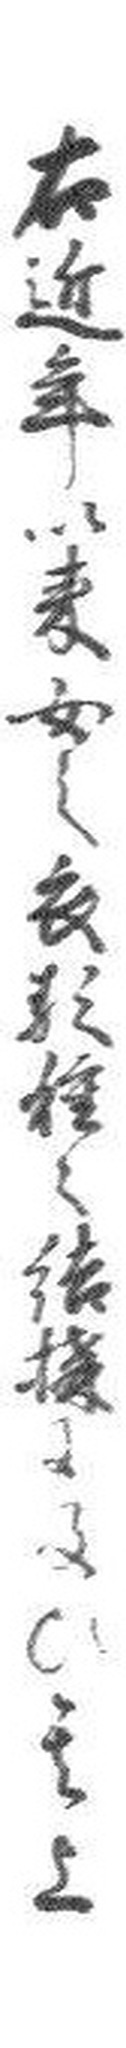右近年以来女之衣類種々結構に及ひ其上
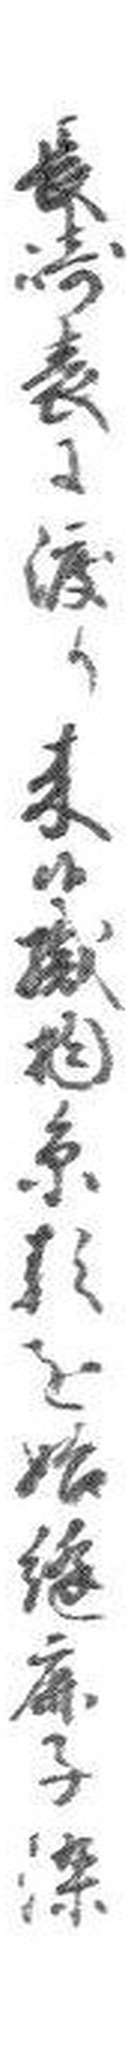長崎表に渡り来候織物京都糸類を始縫鹿子染
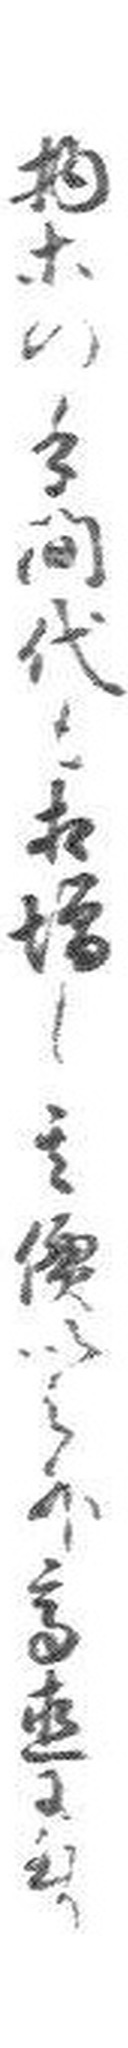物等の手間代も相増し其價以之外高値に至り
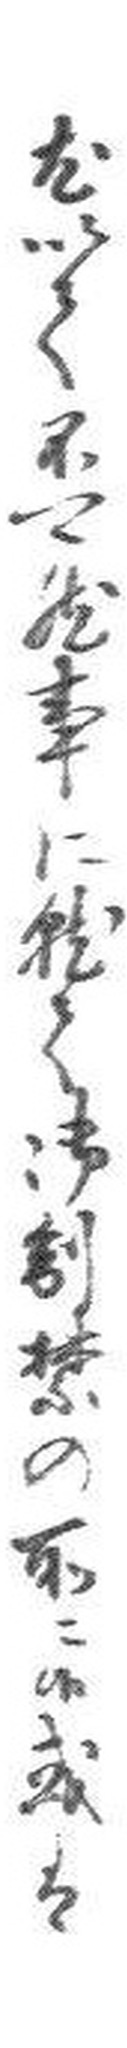尤以て不可然事に就て御制禁の所ニ候或は
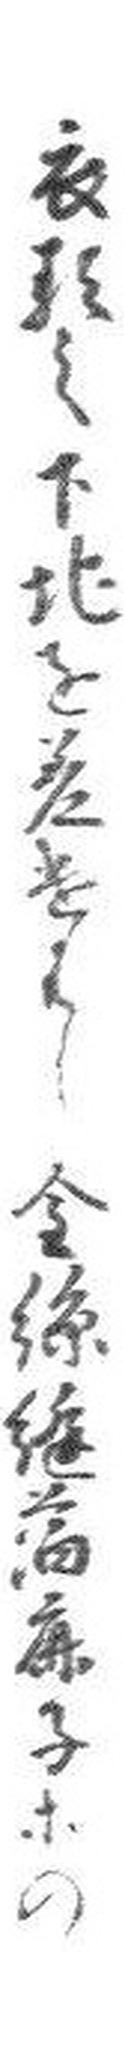衣類の下地を差遣はし金銯縫箔鹿子等の
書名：家譜 二十九 吉邦公 従正徳二年到正徳三年
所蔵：福井県文書館 Fukui Prefectural Archives
